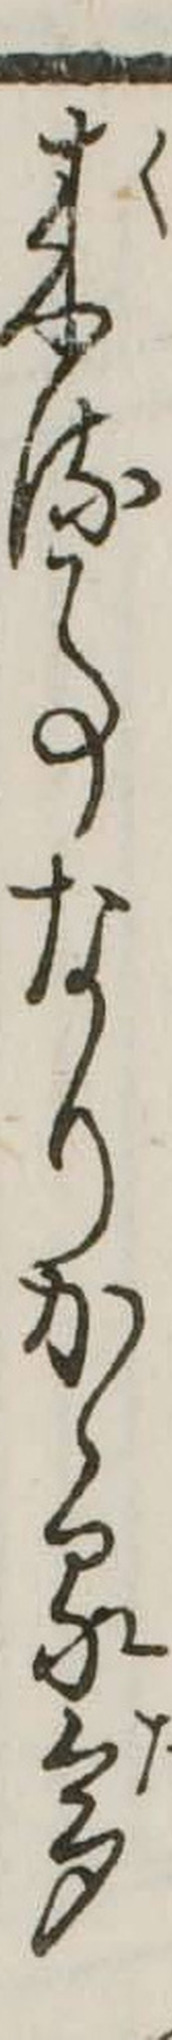来る事なりかゝる多
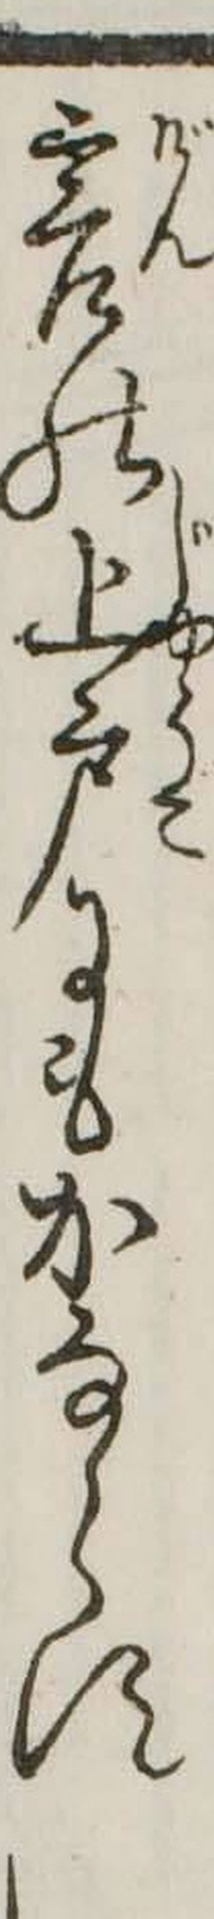言の上戸にもかならす
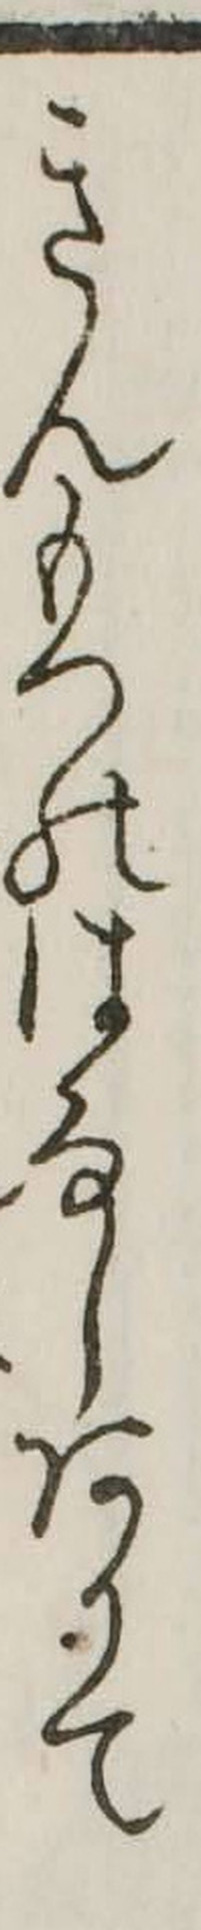きんもつのはなしありて
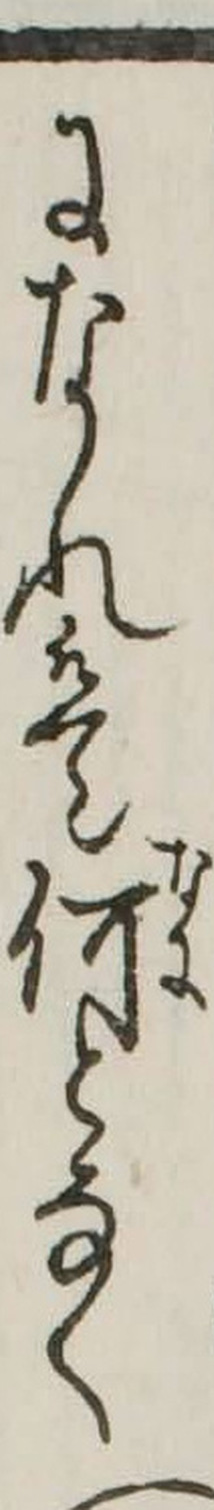になれは何となく
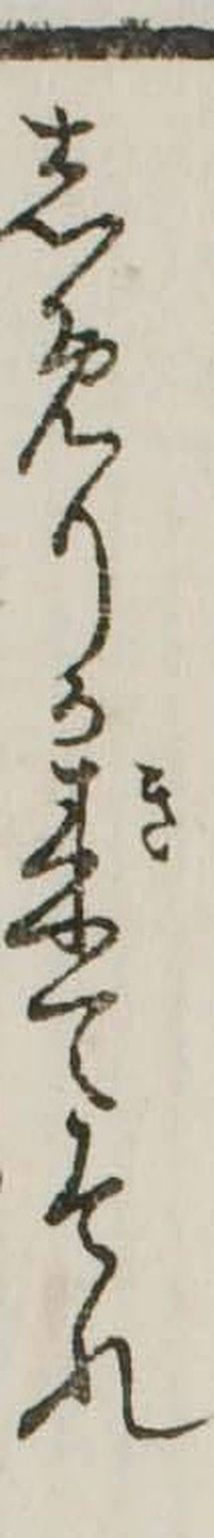しめりか来てそれ
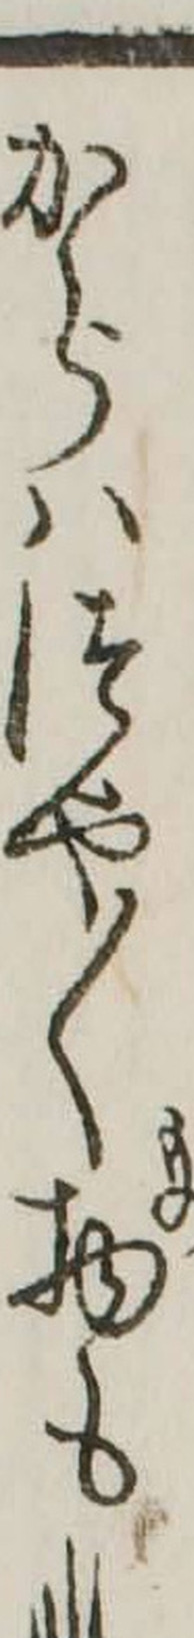からはつや〳〵物も
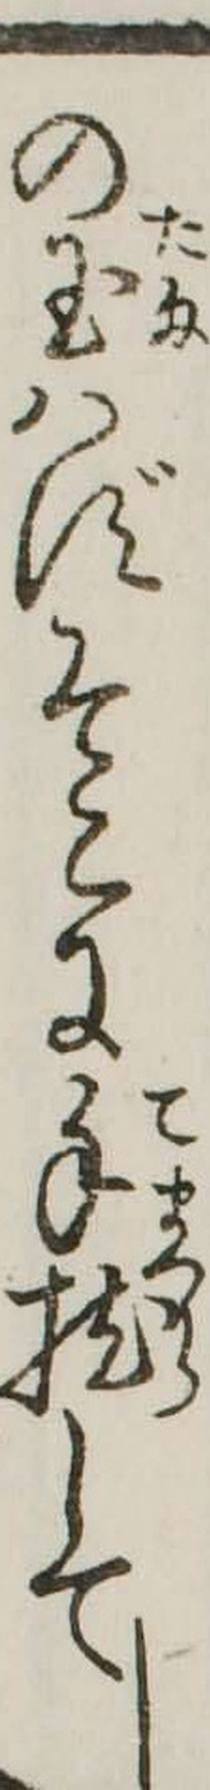の玉はずそこに手枕して
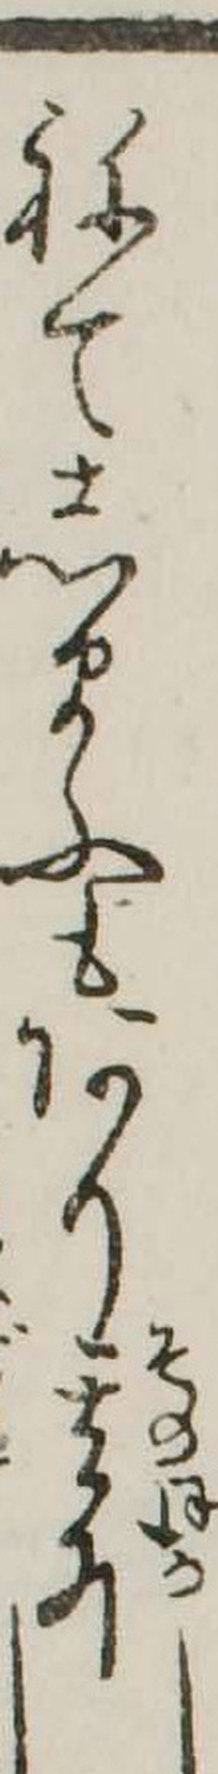ねてしまふもあり其外
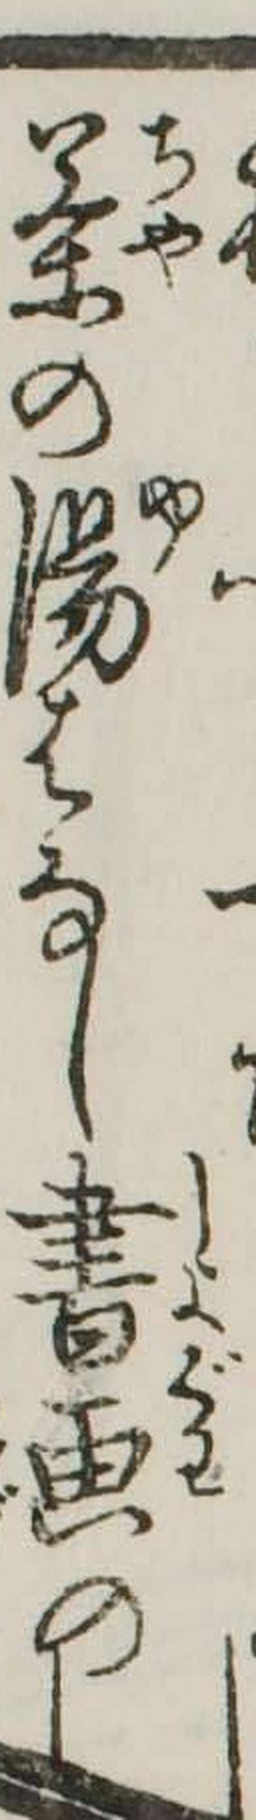茶の湯はなし書画の
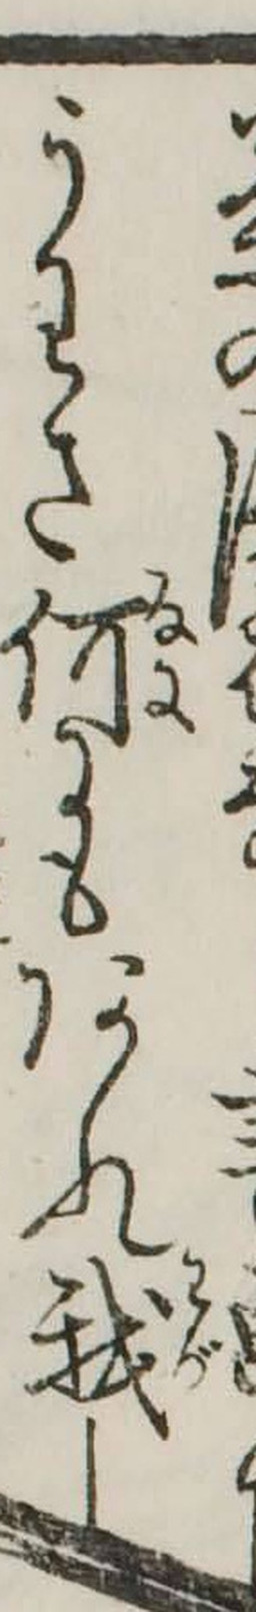うわさ何にもあれ我
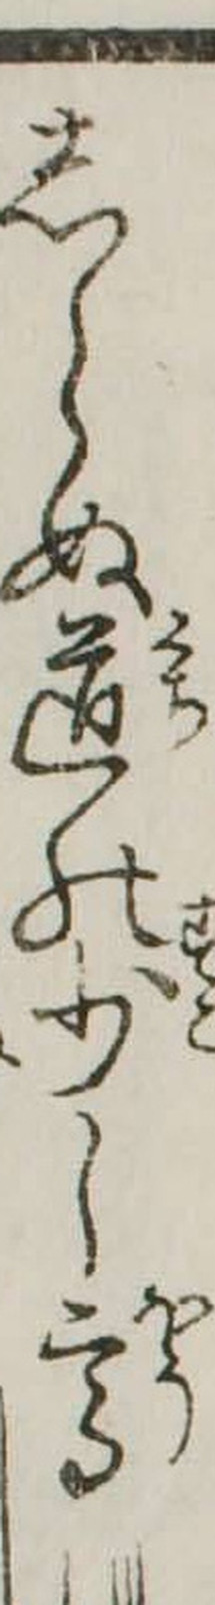しらぬ道の少し高
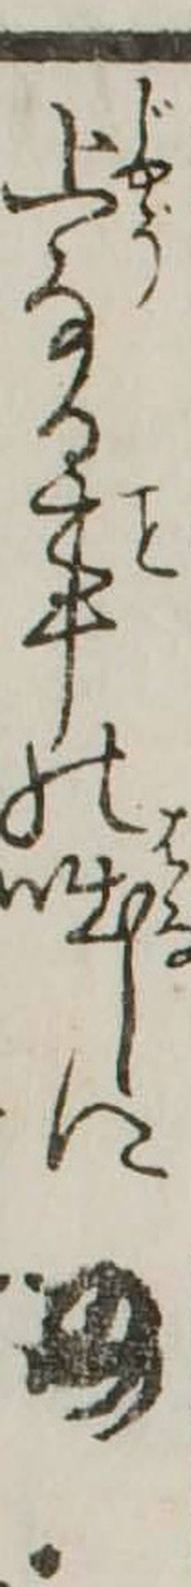上なる事の咄しに
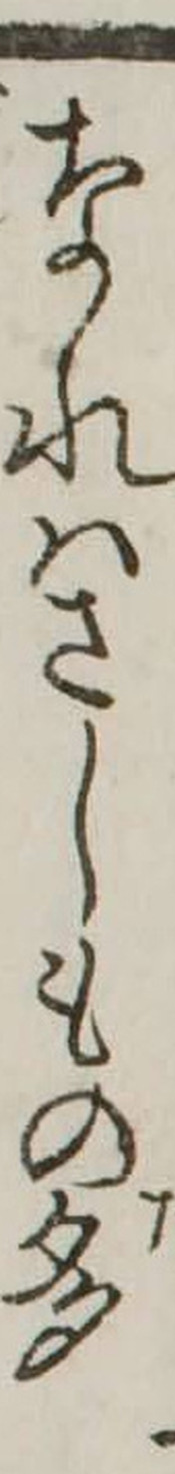なれはさしもの多
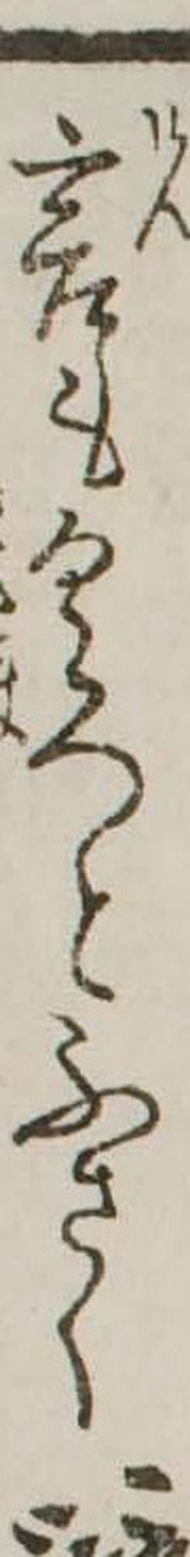言もくつとふさく
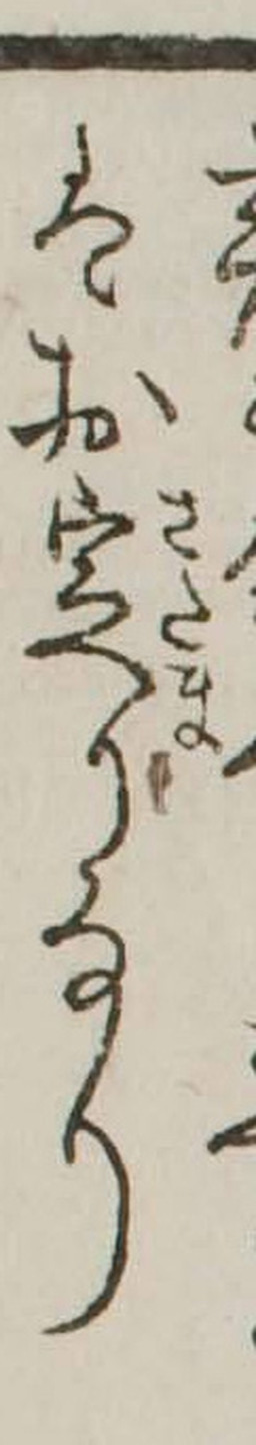はお定りなり

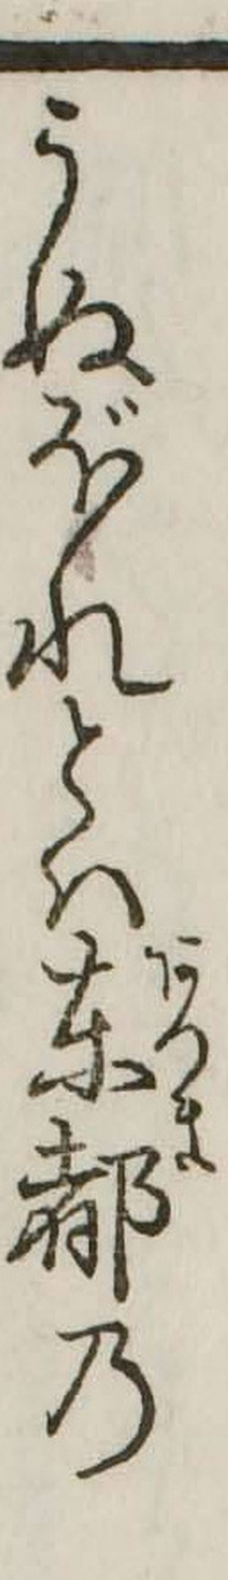うぬぼれとは東都の
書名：繪本不盡泉
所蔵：国文学研究資料館
